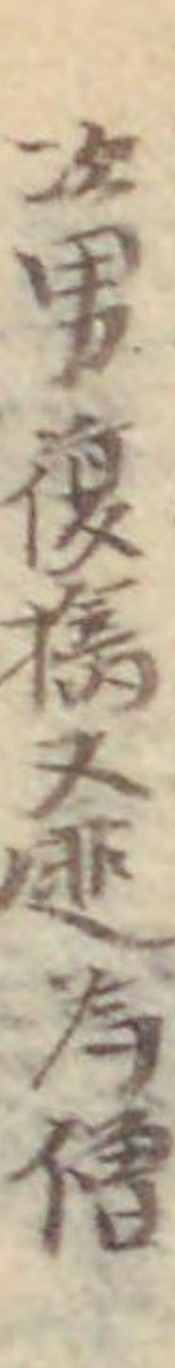次男復檎又逃為僧
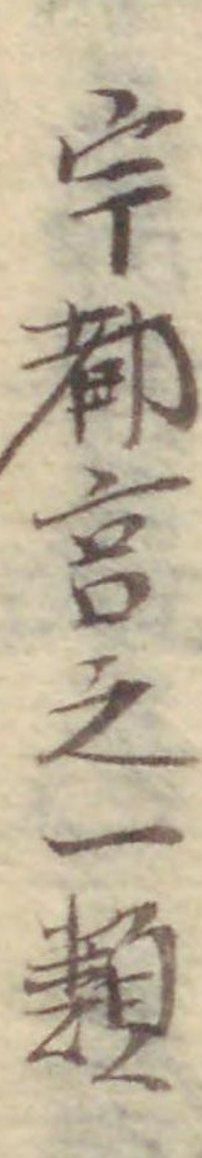宇都宮之一類
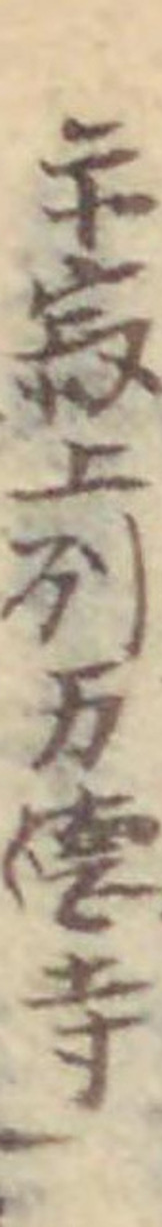示寂上州万徳寺
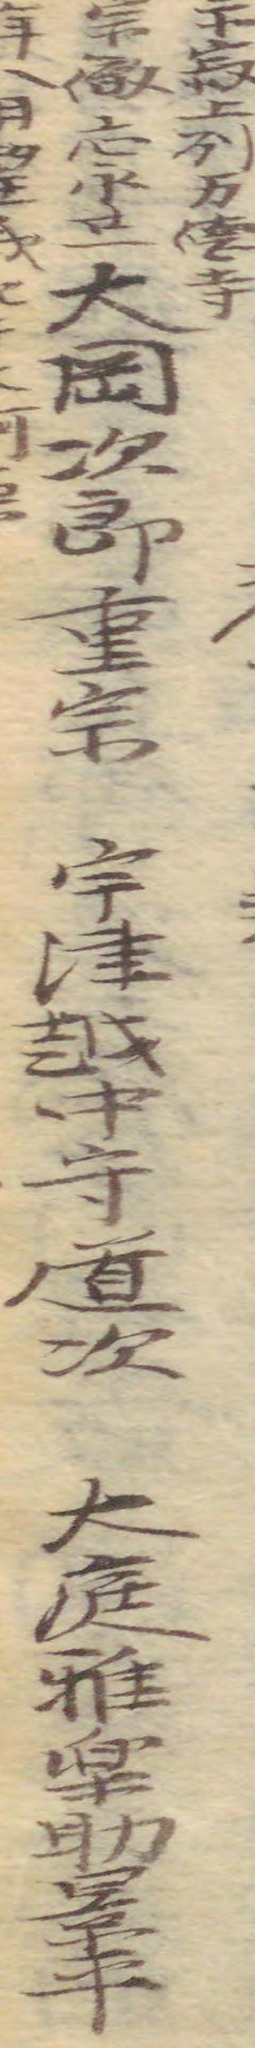大岡次郎重宗宇津越中守道次大庭雅助景平
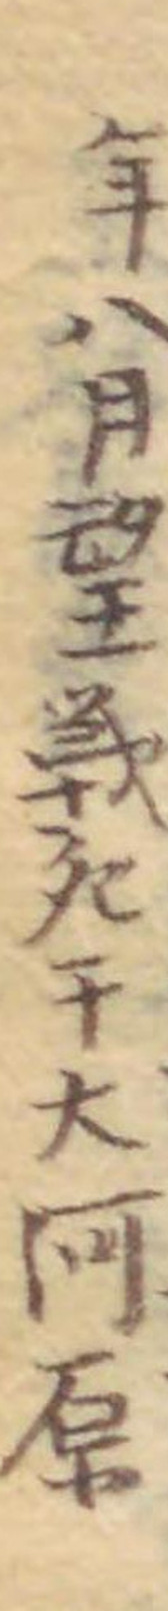年八月望戦死于大河原

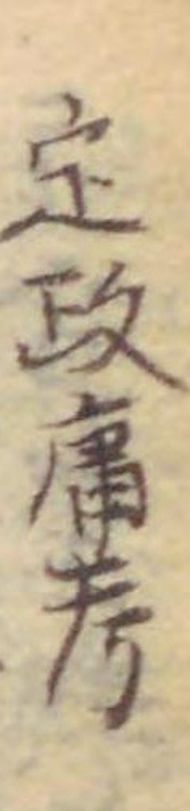定政庸考
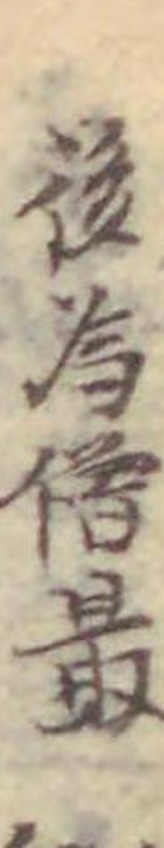後為僧最
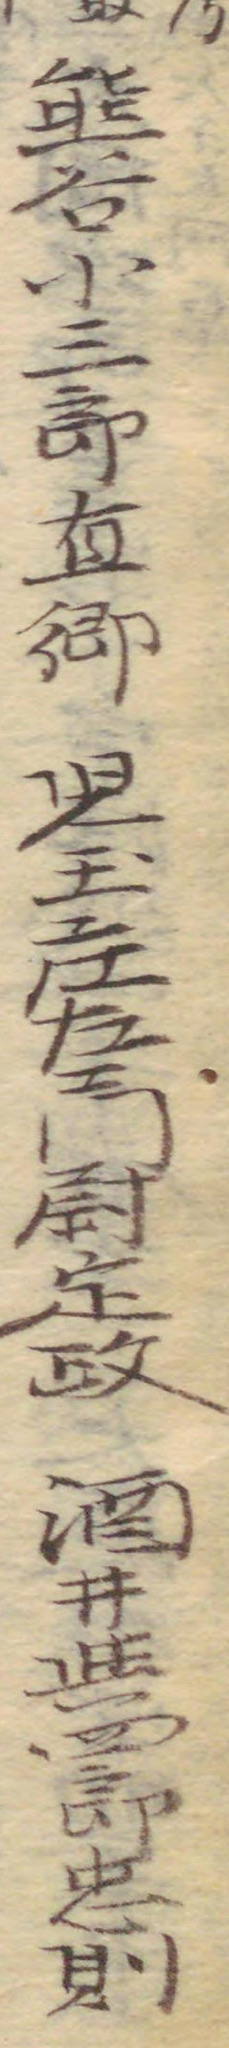熊谷小三郎直郷児玉庄左エ門尉定政酒井與四郎忠則
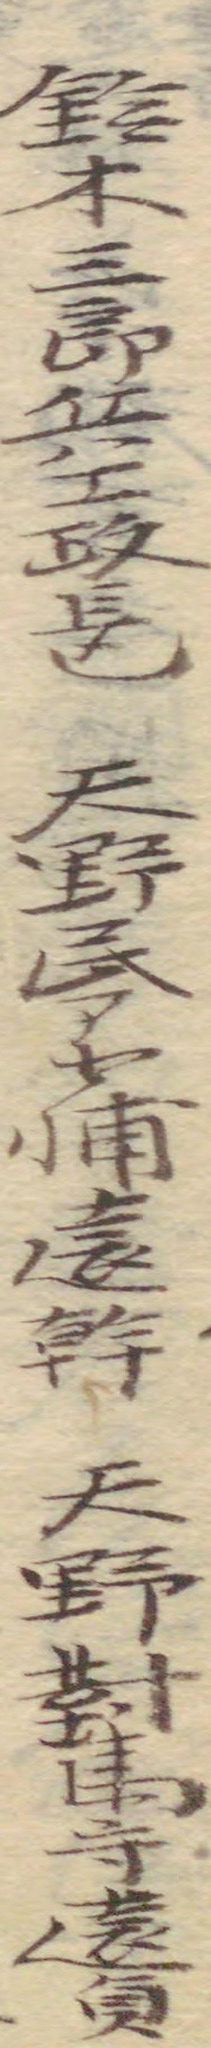鈴木三郎兵エ政長天野民部少輔遠幹天野対馬守遠貞
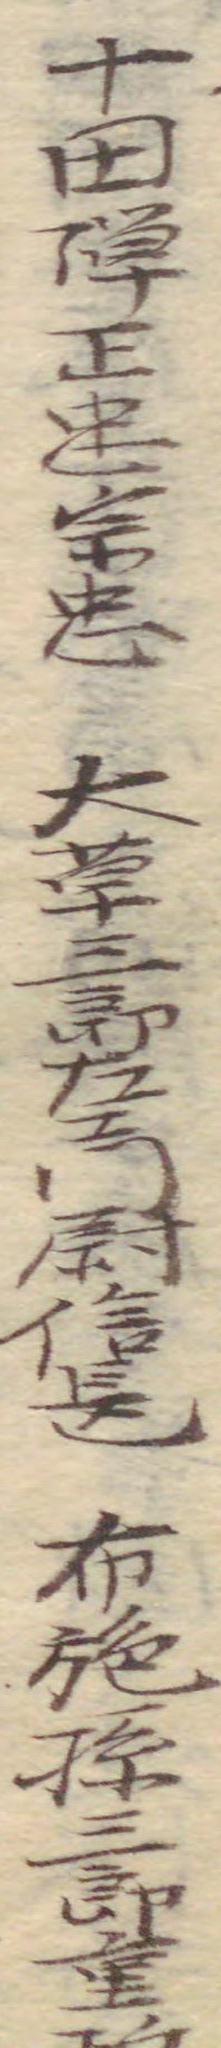十田弾正忠宗忠大草三郎左エ門尉信長布施孫三郎重政
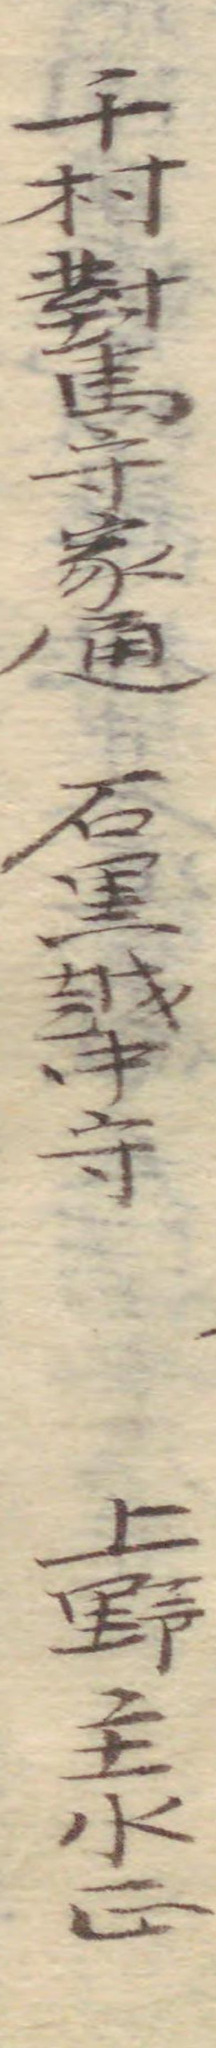千村対馬守家通石黒越中守上野主水正
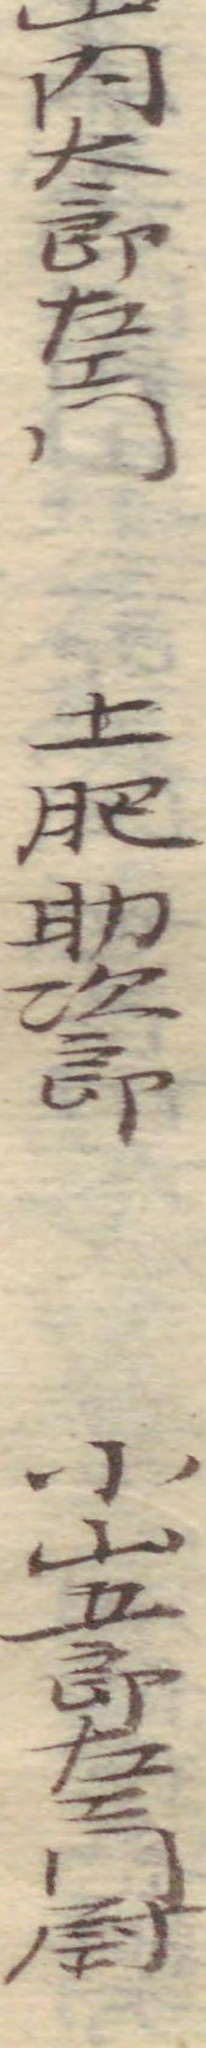山内太郎左エ門土肥助次郎小山五郎左エ門尉
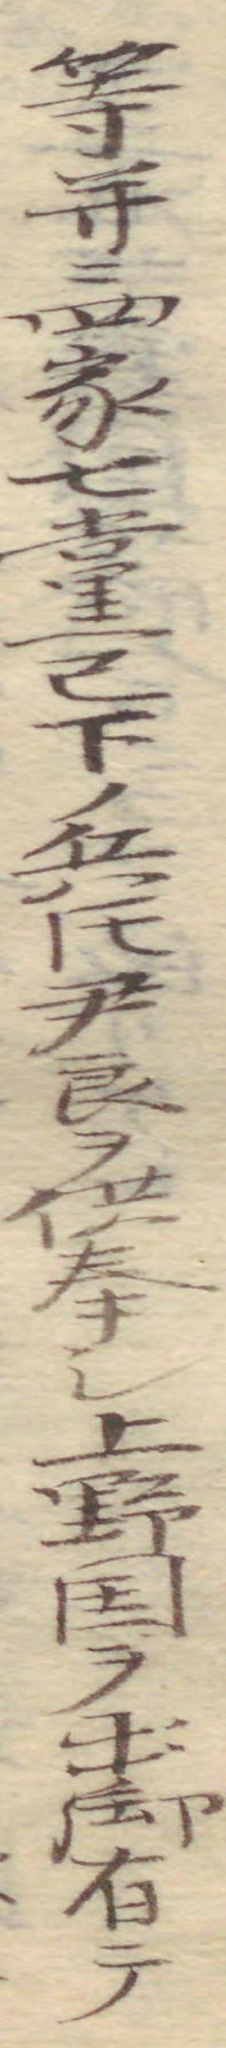等幷ニ四家七党已下ノ兵トモ尹良ヲ供奉シ上野国ヲ出御有テ
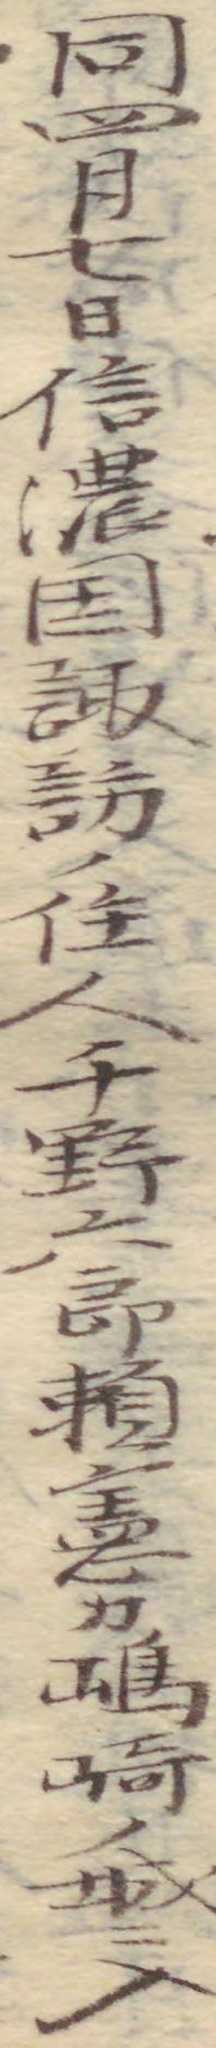同四月七日信濃国諏訪ノ住人千野六郎頼憲カ嶋崎ノ城ニ入
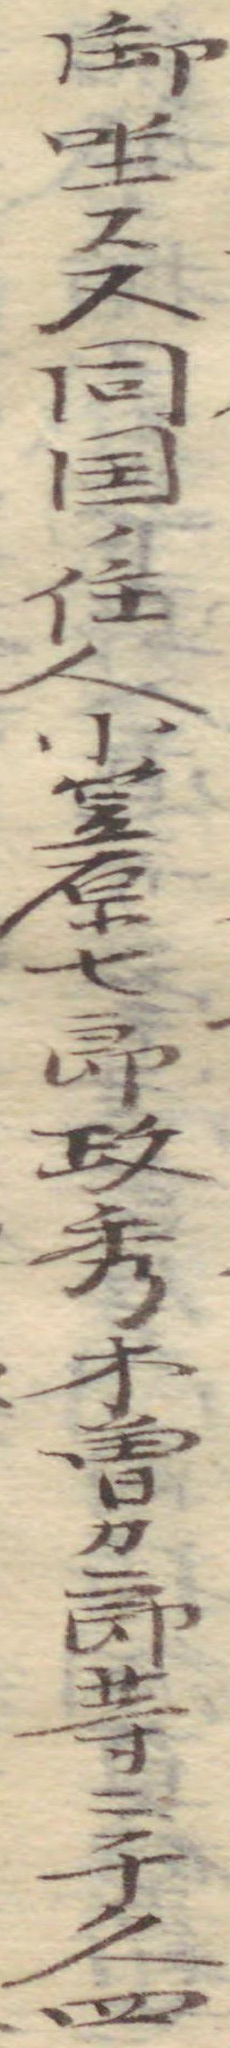御坐ス又同国ノ住人小笠原七郎政秀木曽カ郎等二千久四
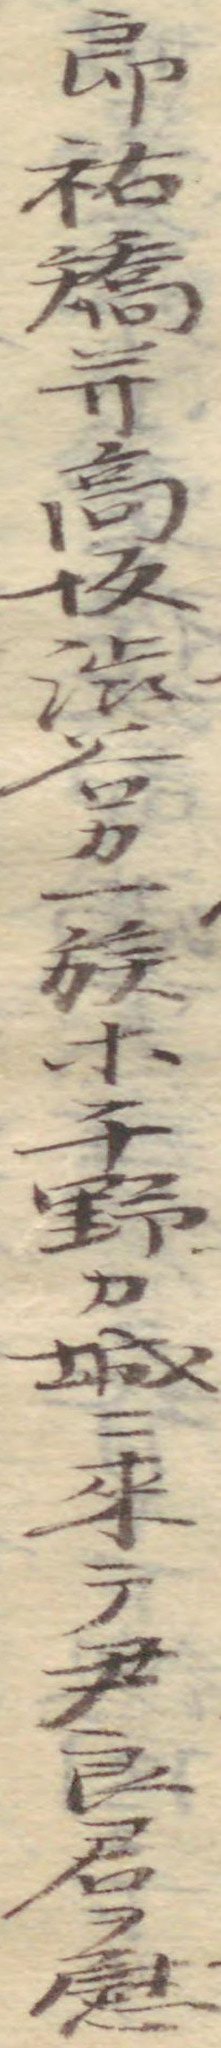郎祐矯幷高坂渋谷カ一族等千野カ城ニ来テ尹良君ヲ慰
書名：鶯宿雑記. 巻199-200
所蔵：国立国会図書館 National Diet Library, JAPAN
